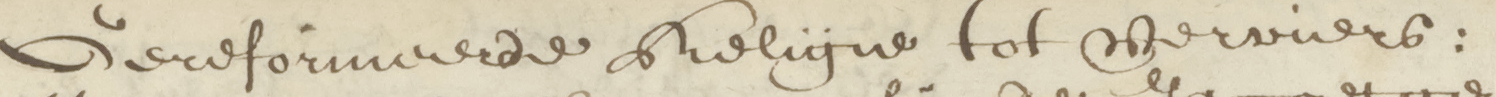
Gereformeerde Religie tot Verviers:
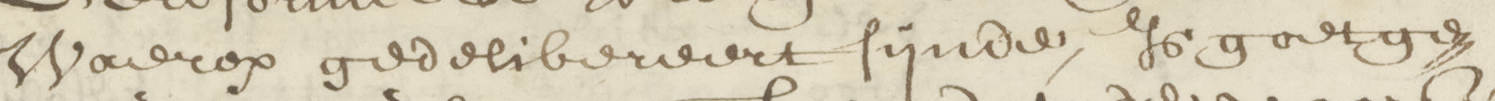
Waerop gedelibereert sijnde, Is goetge„
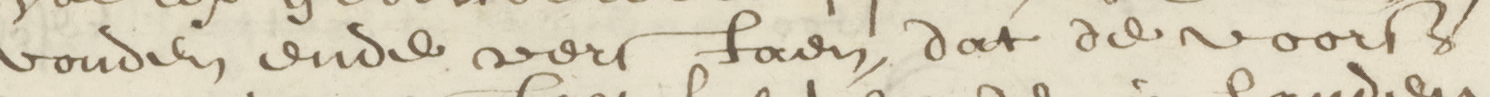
vonden ende verstaen, dat de voorss.
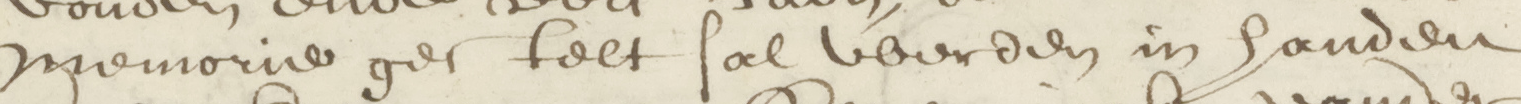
memorie gestelt sal werden in handen
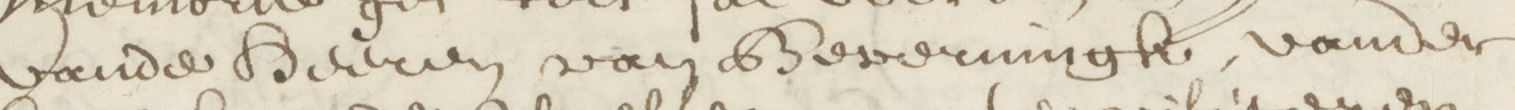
vande Heeren van Beverningk, vander
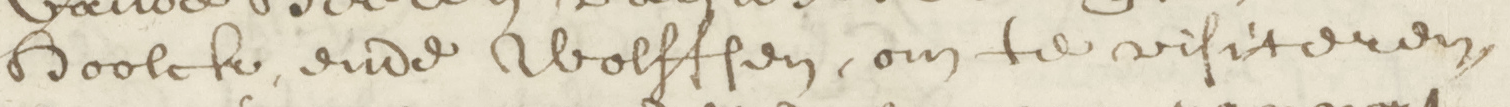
Hoolck ende Wolffsen, om te visiteren,
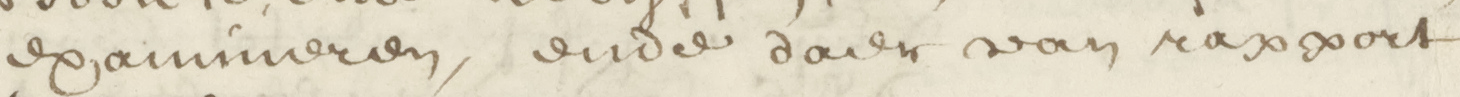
examineren, ende daer van rapport
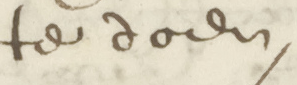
te doen.
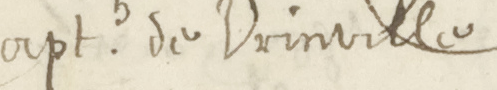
Captn. de Vrinville
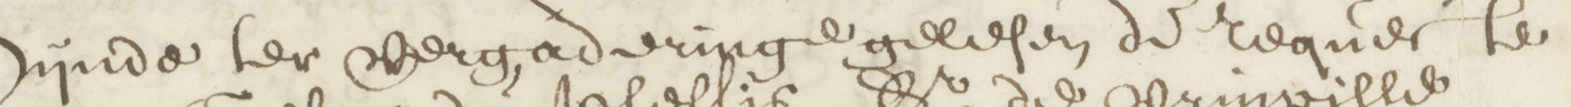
Sijnde ter Vergaderinge gelesen de requeste
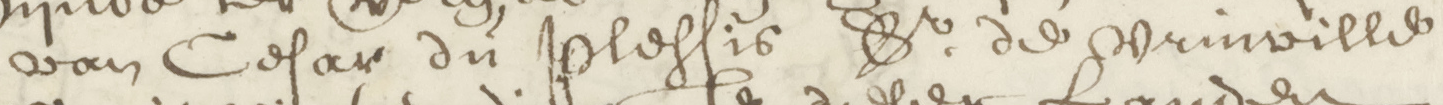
van Cesar du Plessis Sr. de Vrinville
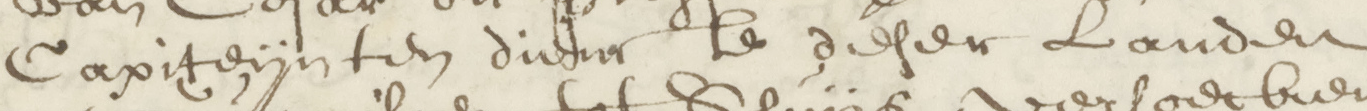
Capiteijn ten dienste deser Landen
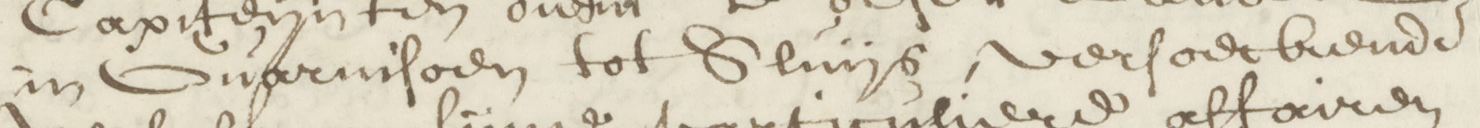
in Guarnisoen tot Sluijs, versoeckende
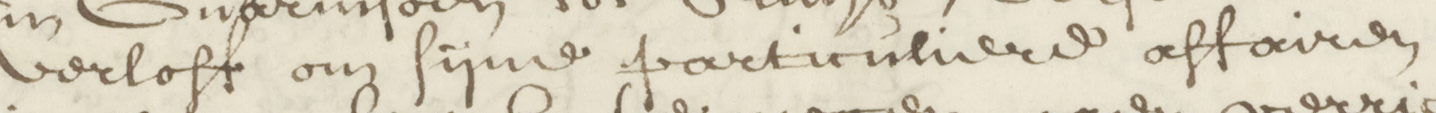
verloff om sijne particuliere affairen
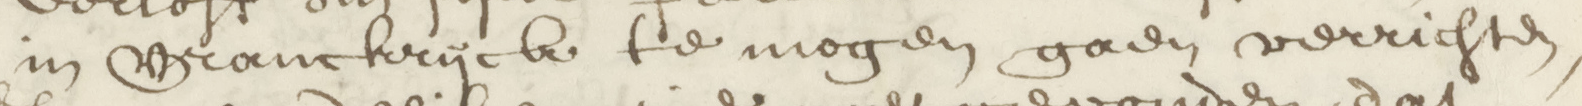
in Vranckrijck te mogen gaen verrichten,
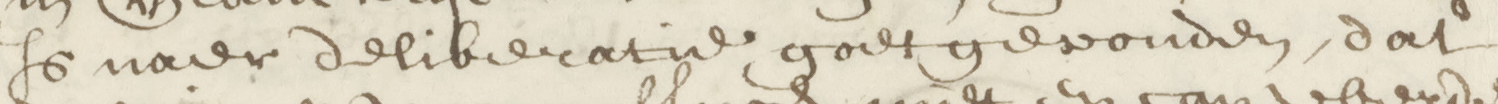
Is naer deliberatie goetgevonden, dat
